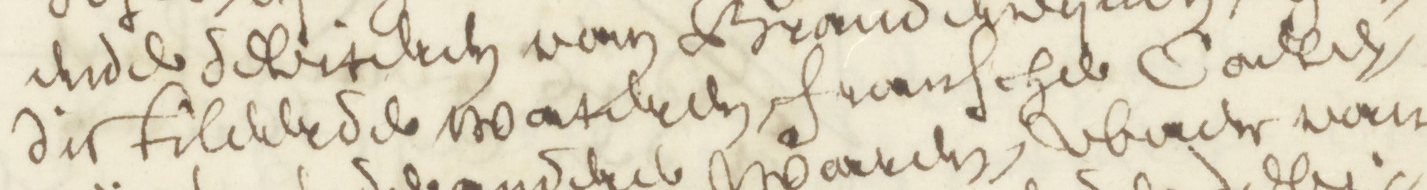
distileerde wateren, Fransche Coele,,
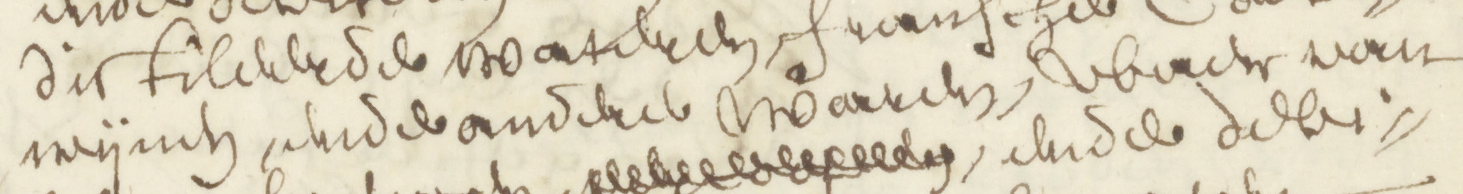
wijnen, ende andere Waren, waer van
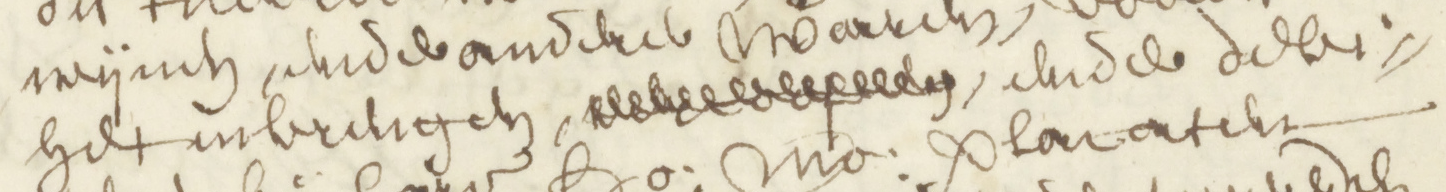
het inbringen, vercoopen, ende debi„
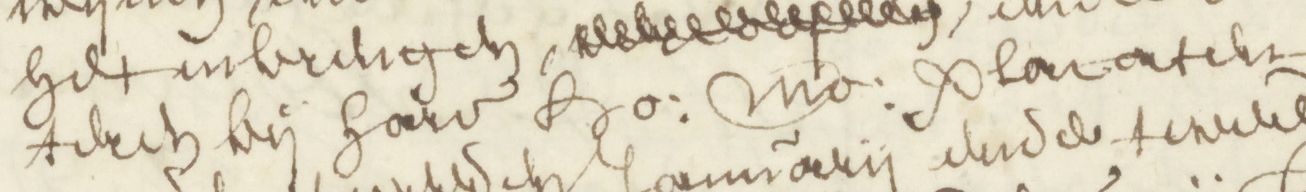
teren bij hare Ho:Mo: Placaten
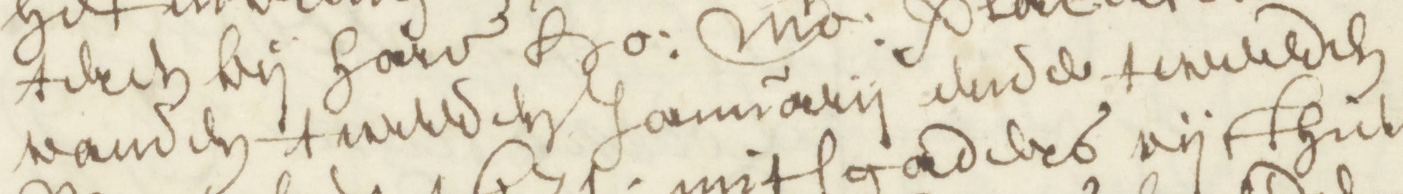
vanden tweeden Januarij ende tweeden
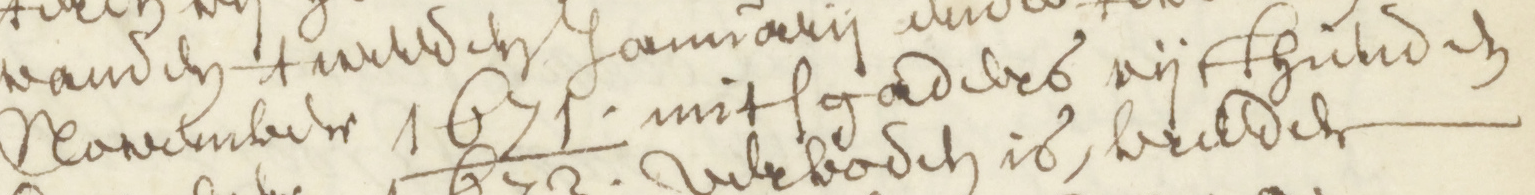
November 1671. mitsgaders vijfthienden
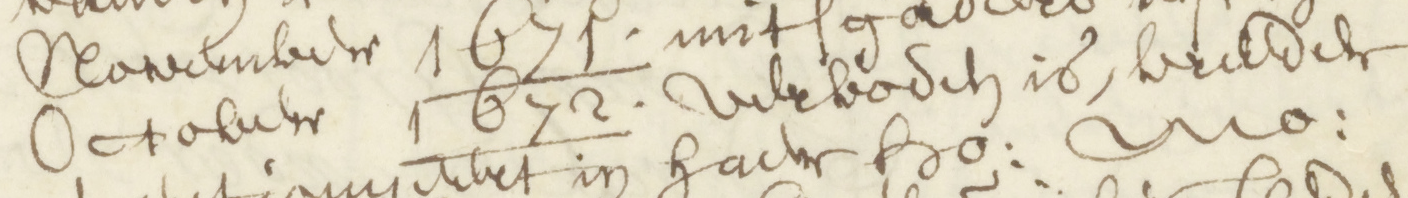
October 1672. verboden is, breeder
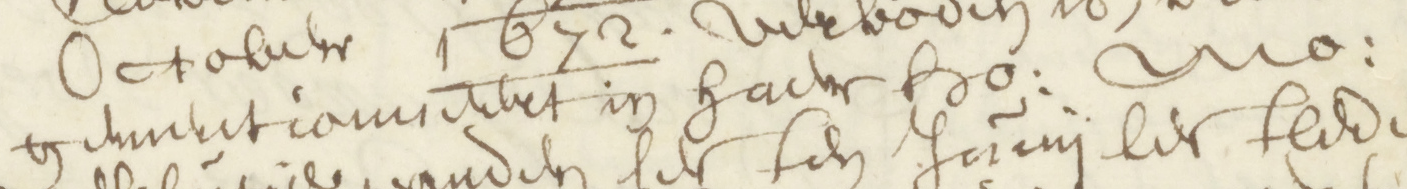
gementionneert in haer Ho:Mo:
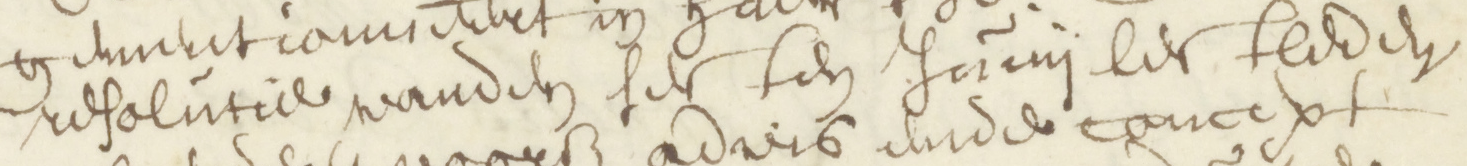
resolutie vanden sesten Junij lestleden,
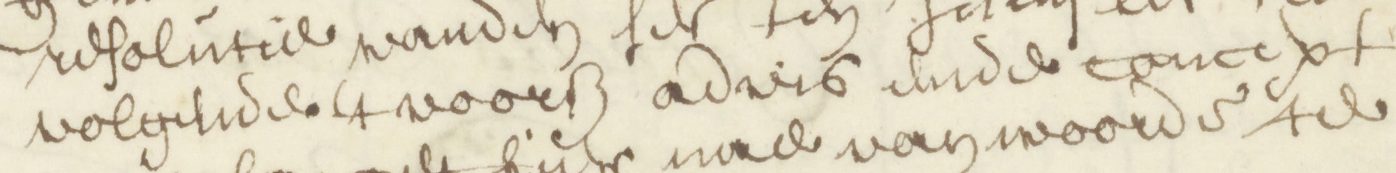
volgende ‛t voors advis ende concept
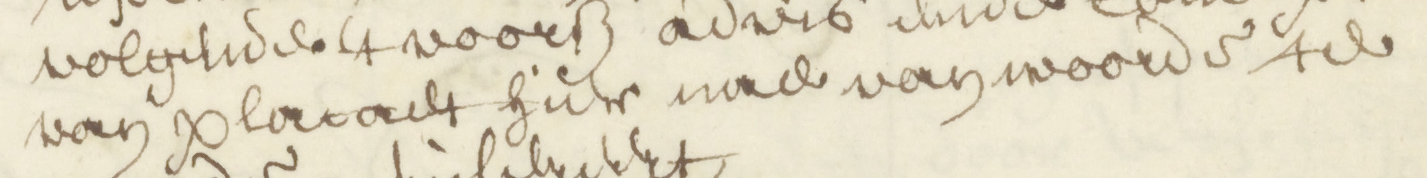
van placaet hier nae van woorde te
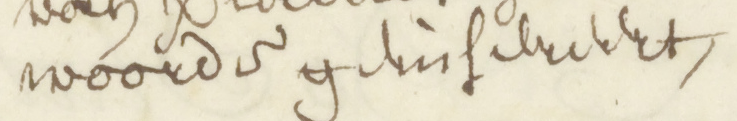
woorde geinsereert.
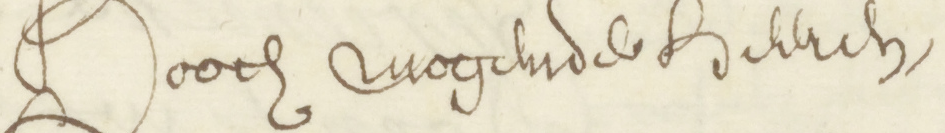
Hooch mogende Heeren,
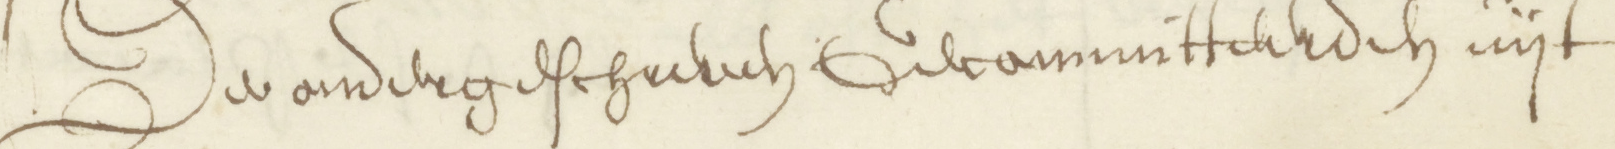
De ondergeschreven Gecommitteerden uijt
